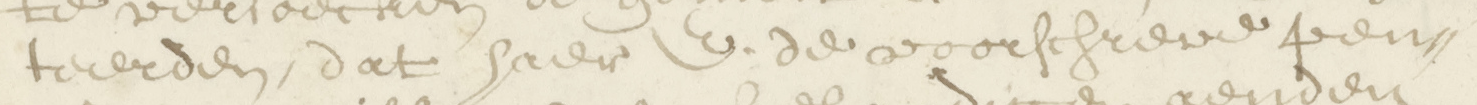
teerden, dat haer E. voorschreve pen„
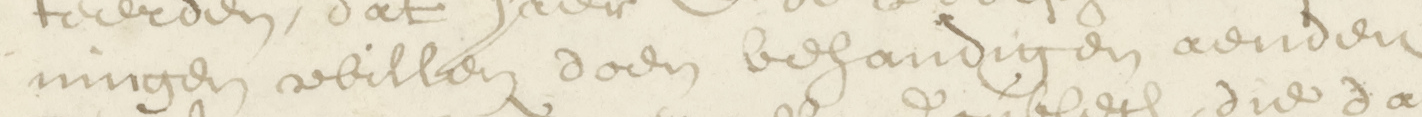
ningen willen doen behandigen aenden
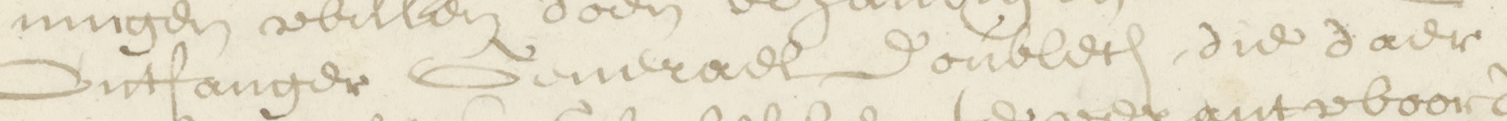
Ontfanger Generael Doubleth, die daer
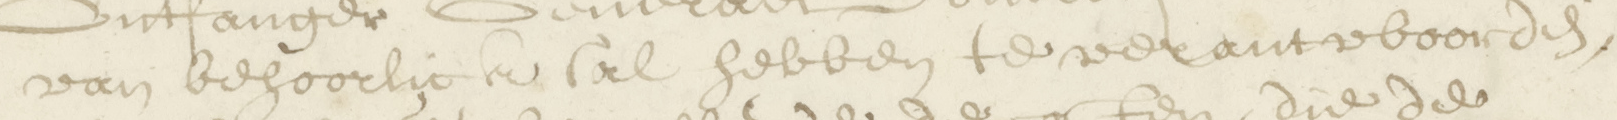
van behoorlick sal hebben te verantwoorden,
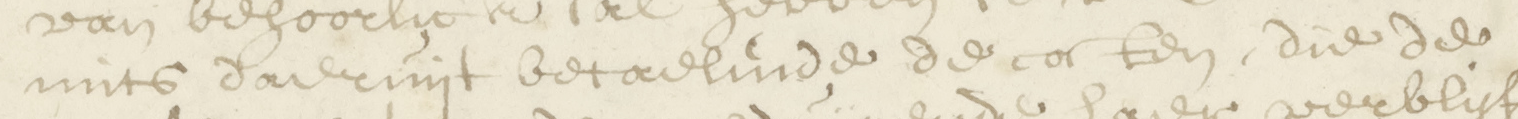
mits daeruijt betaelende de costen, die de
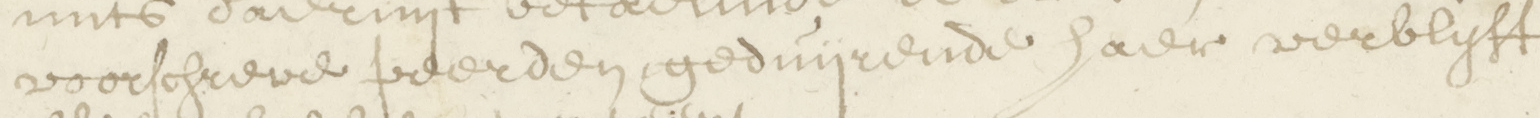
voorschreve peerden geduijrende haer verblijff
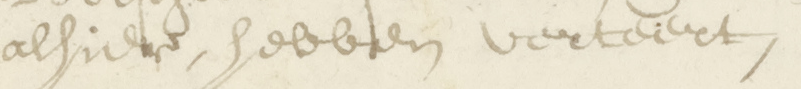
alhier, hebben verteert.
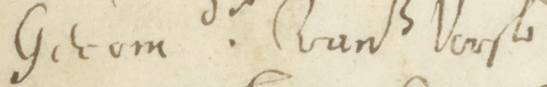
Gecomden. van Vorste
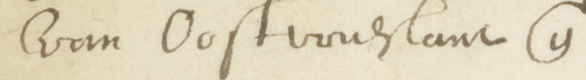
van Oostvrieslant &
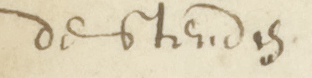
de stenden
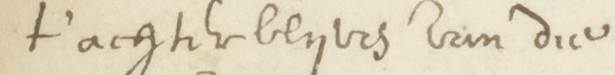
t'achterblyven van die
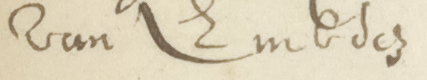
van Embden
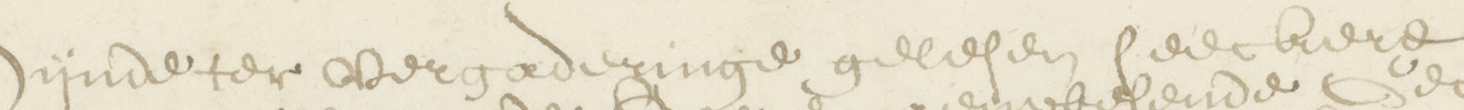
Sijnde ter vergaderinge gelesen seeckere
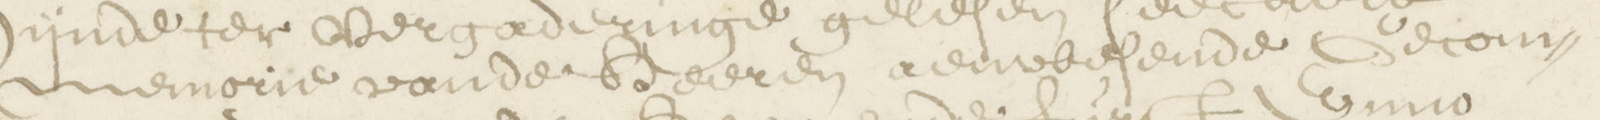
memorie van de Heeren aenwesende Gecom„
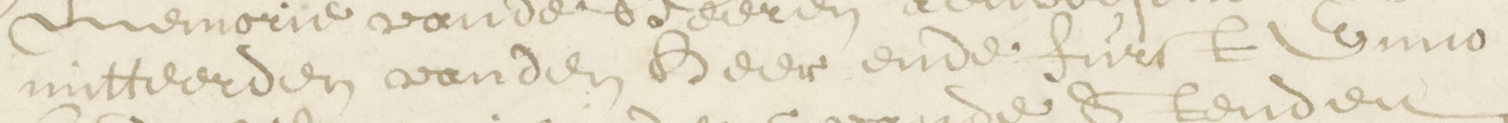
mitteerden van den Heer ende furst Enno
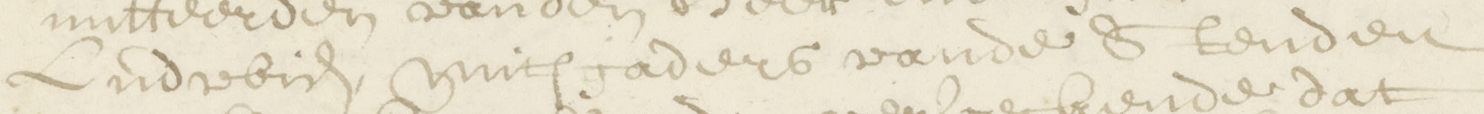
Ludwich, mitsgaders vande Stenden
